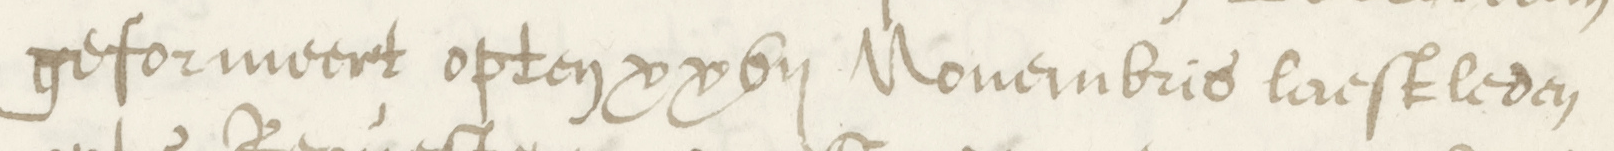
geformeert opten xxvij Nouembris laestleden
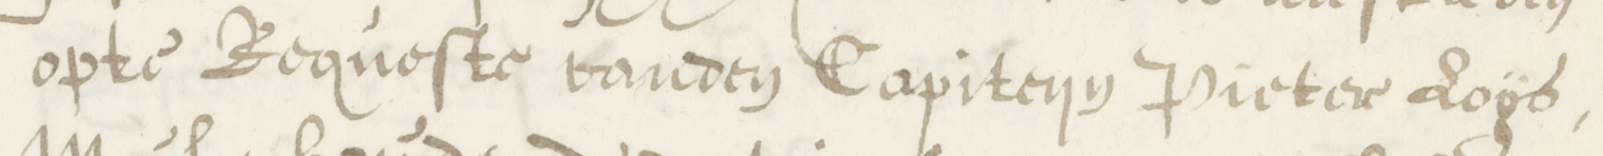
opte Requeste vanden Capiteyn Pieter Loijs,
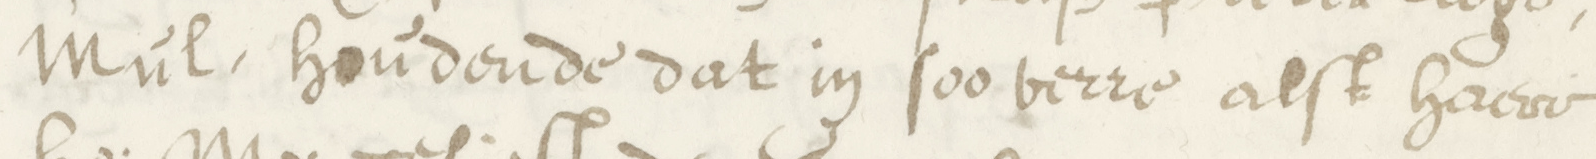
Mul, houdende dat in soo verre alst haere
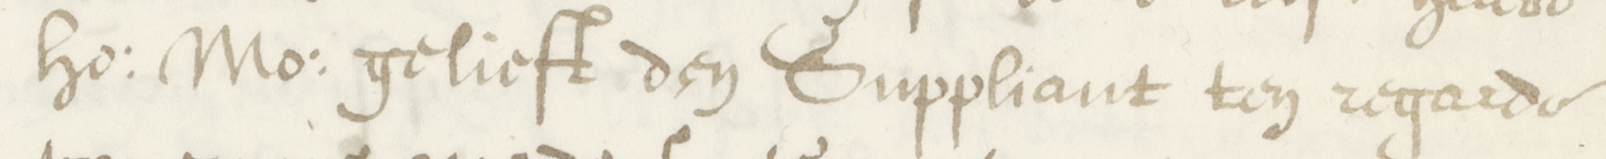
ho:Mo: gelieft den Suppliant ten regarde
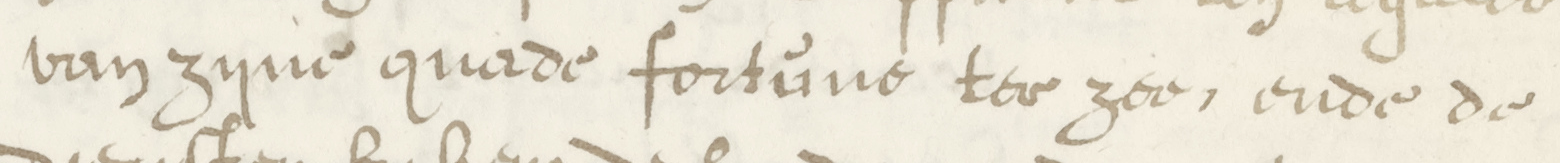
van zyne quade fortune ter zee, ende de
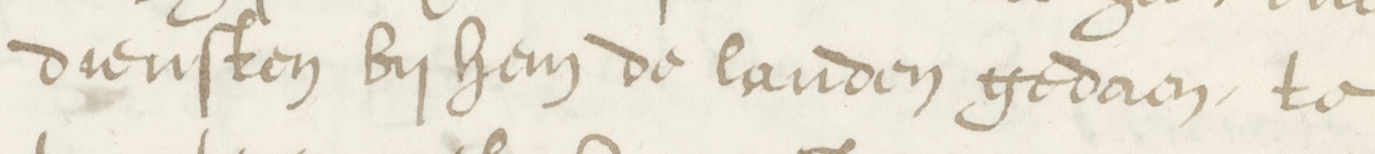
diensten by hem de landen gedaen, te
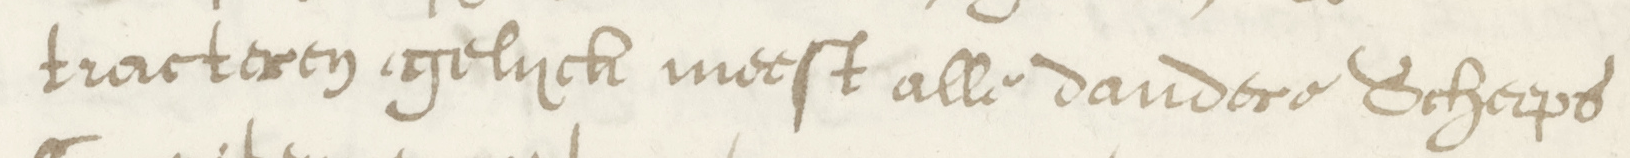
tracteren, gelyck meest alle dandere Scheeps
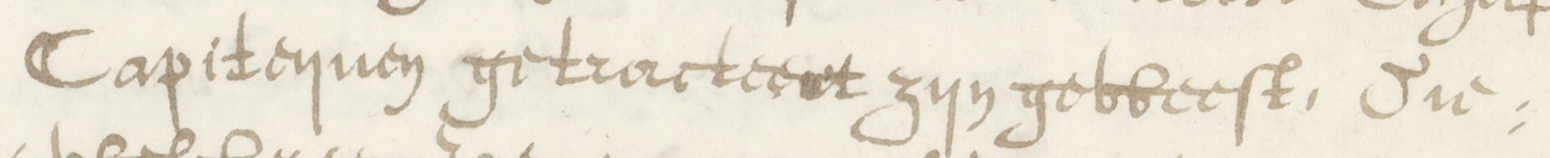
Capiteynen getracteert zyn geweest, Die„
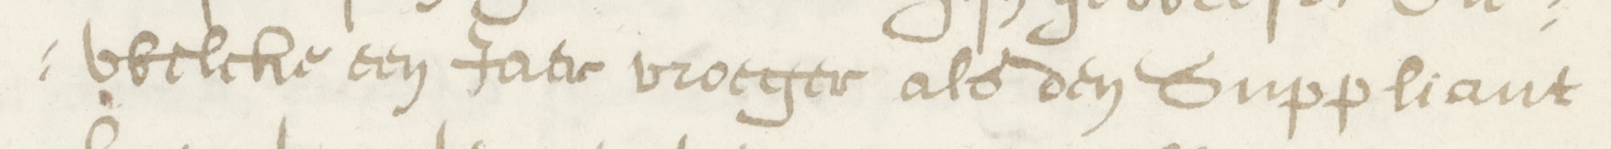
,,welcke een Jaer vroeger als den Suppliant
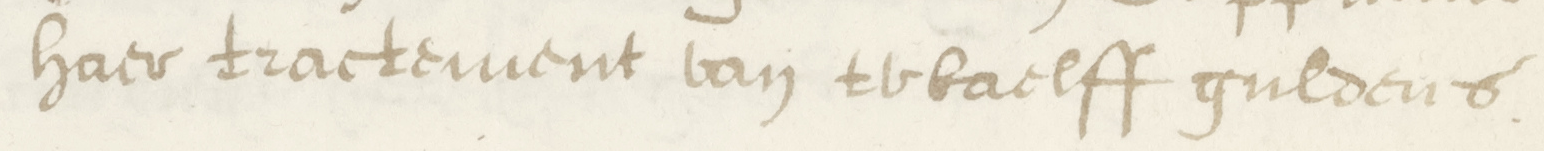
haer tractement van twaelff guldens
